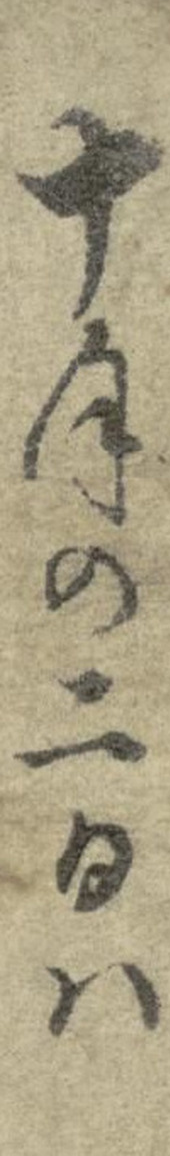十月の二日ハ
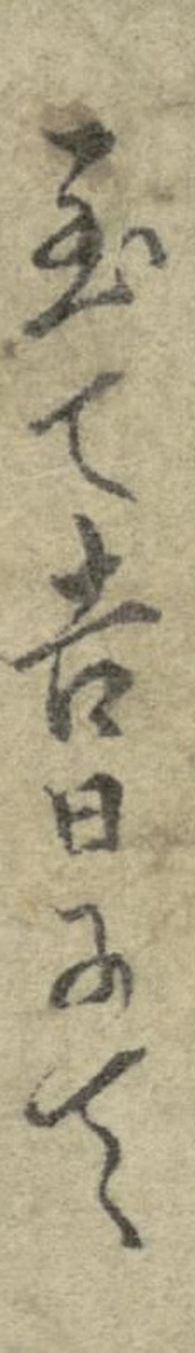至て吉日にて
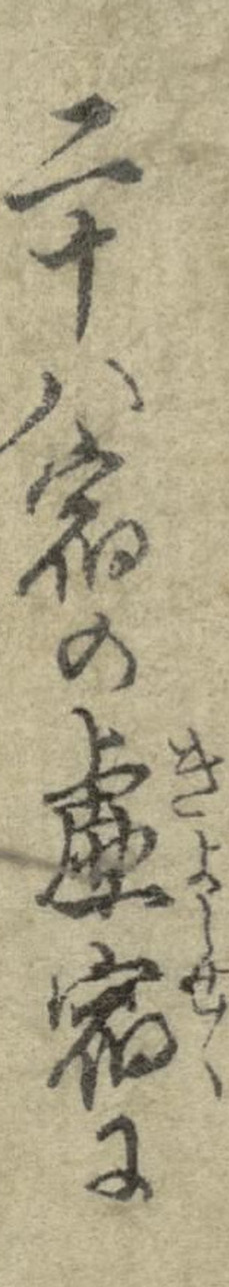二十八宿の虚宿に
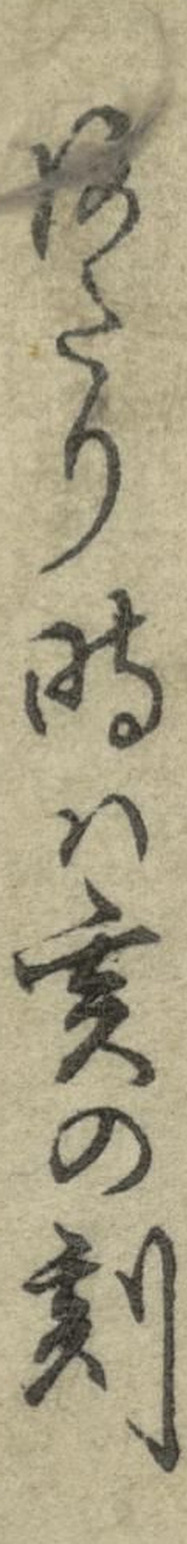あたり時は亥の刻
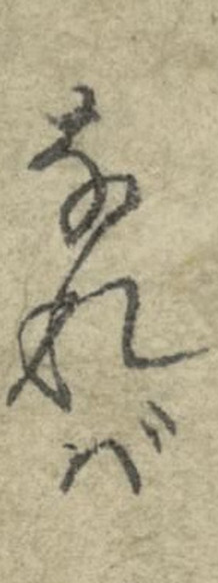なれバ
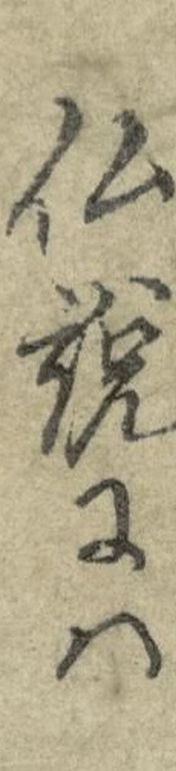仏説にハ
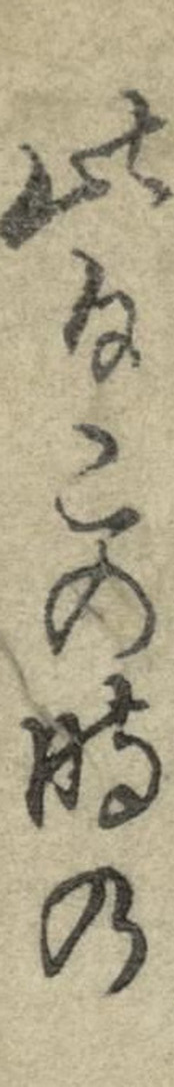此日この時の
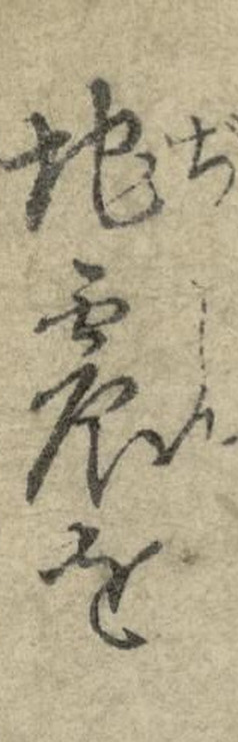地震を
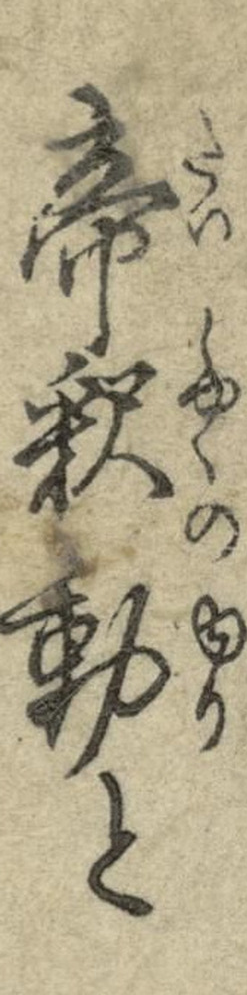帝釈動と
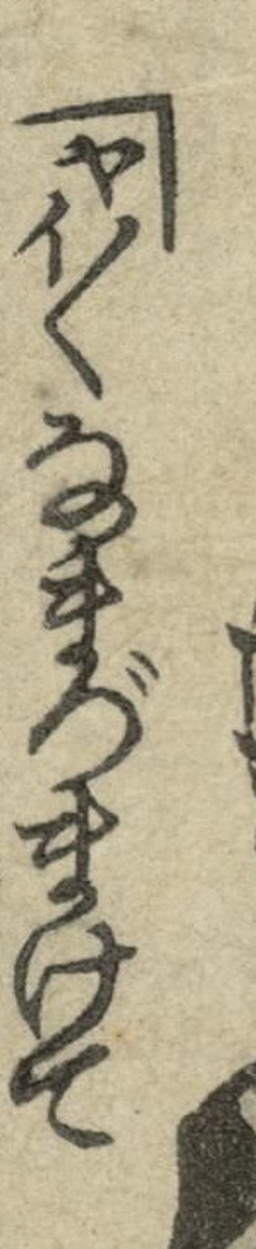〽ヤイ〳〵なまづまけて
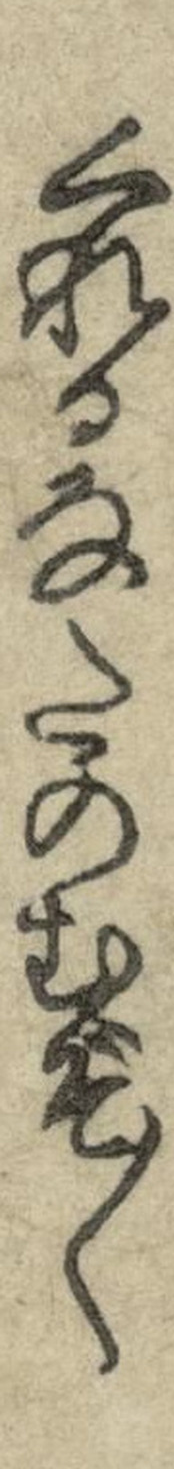くれるなたのむぞ〳〵
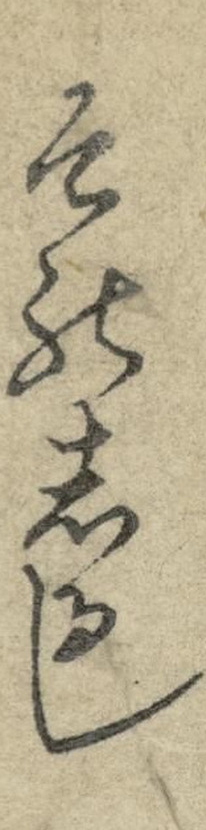そのしるし
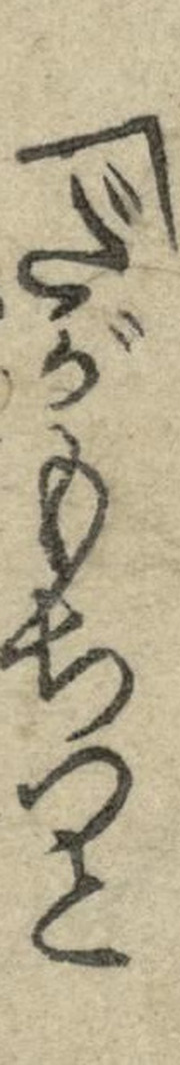〽だがもちつと
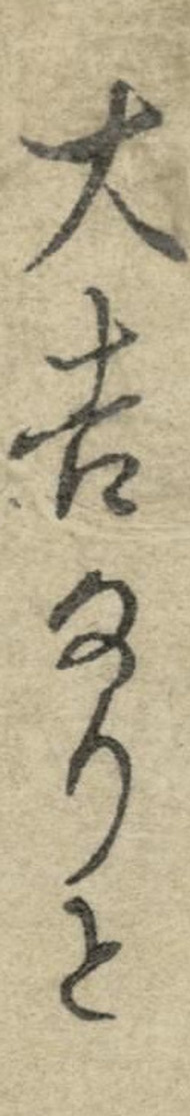大吉なりと
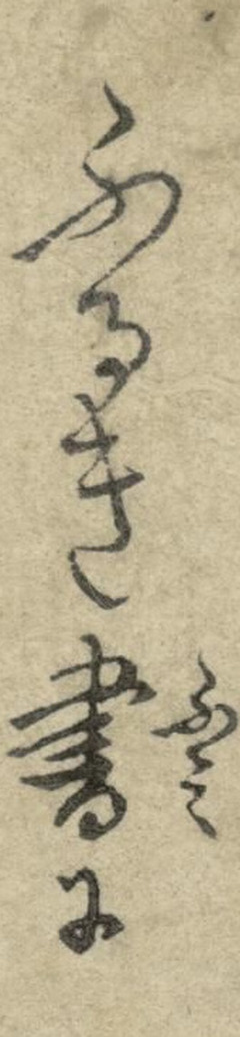ふるき書に
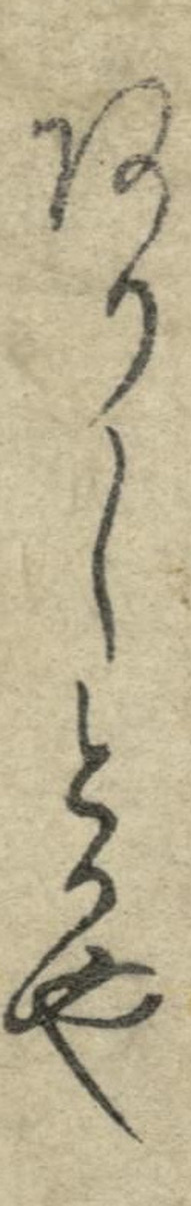ありしとかや
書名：[首引をする地震鯰と鹿島大明神]
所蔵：東京大学地震研究所図書室 Earthquake Research Institute Library, The University of Tokyo, JAPAN
